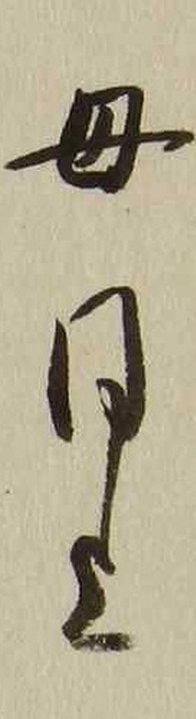母同上
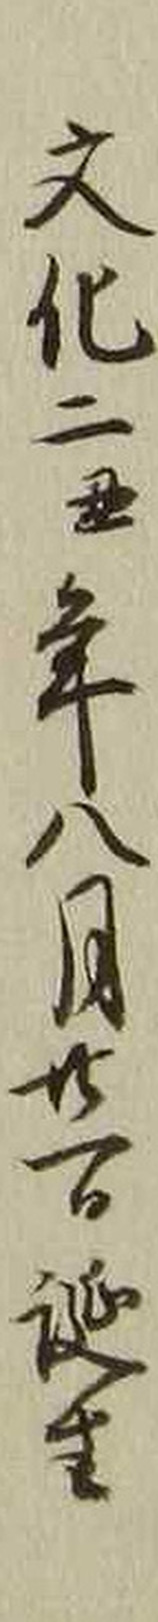女文化二丑年八月廿一日誕生
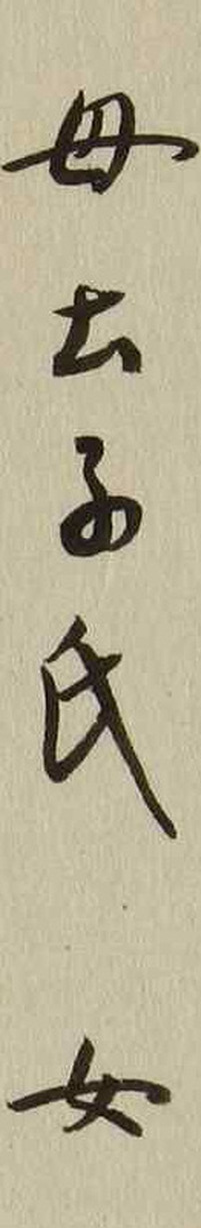母土子氏女
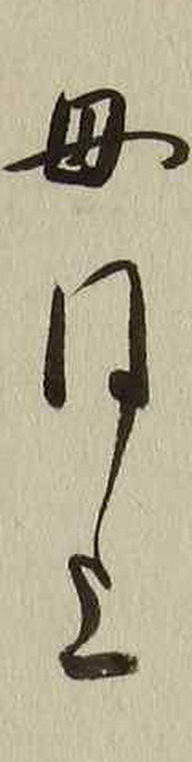母同上
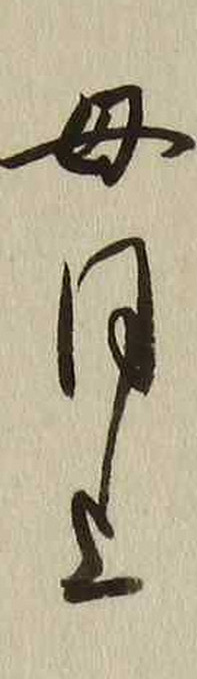母同上
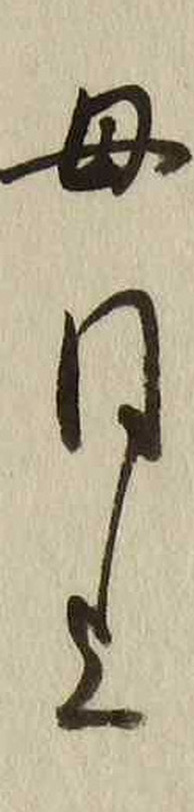母同上
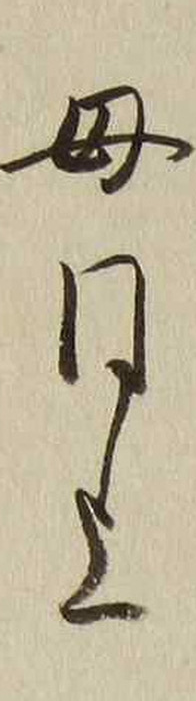母同上
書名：諸士系譜　巻之133　た之部9
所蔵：会津若松市立会津図書館
